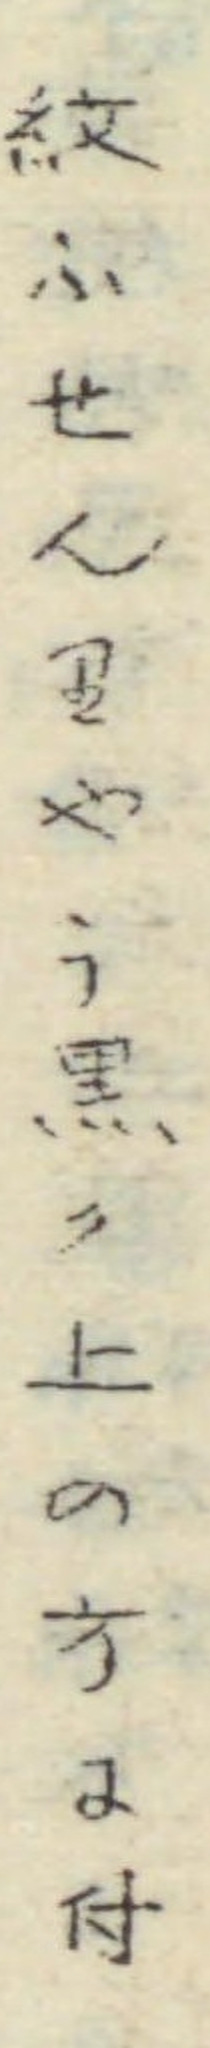紋ふせんりやう黒ク上の方に付
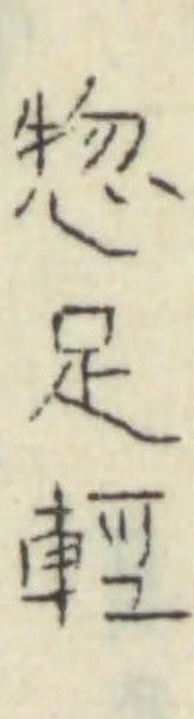惣足軽
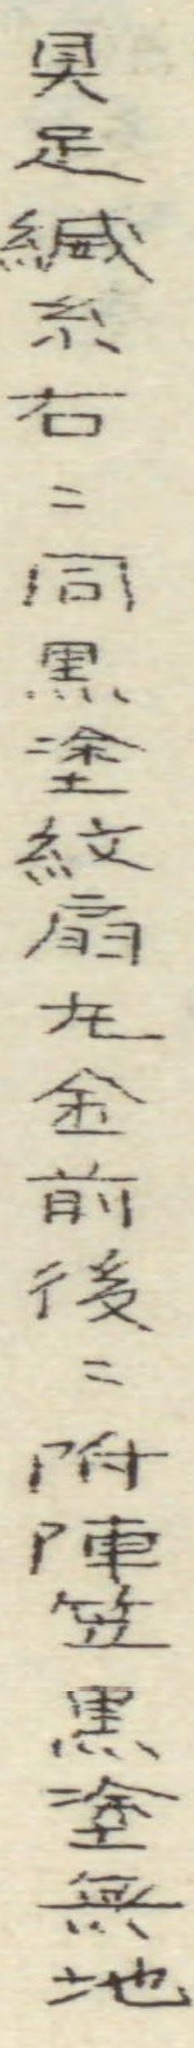具足縅糸右二同黒塗紋扇丸金前後二附陣笠黒塗無地
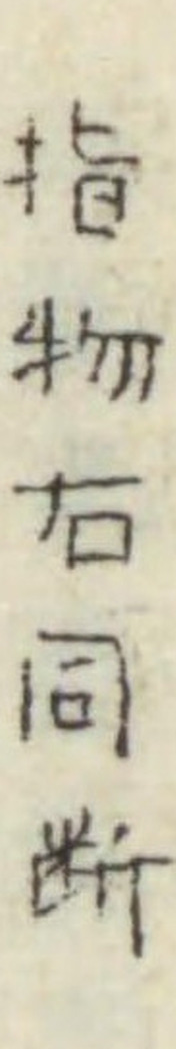指物右同断
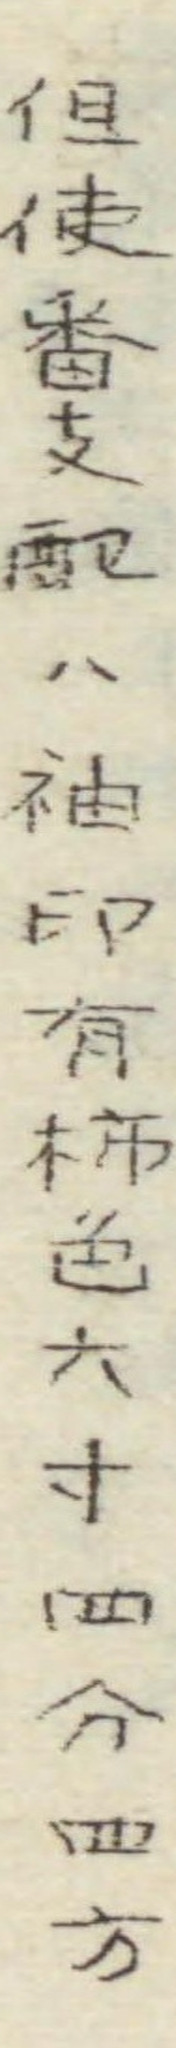但使番支配ハ袖印有柿色六寸四分四方
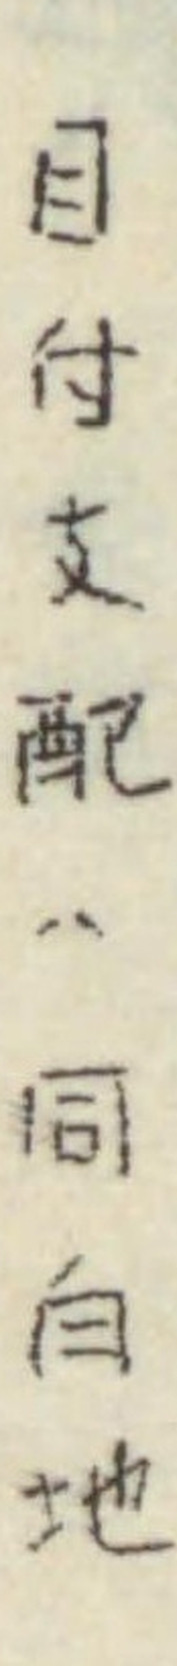目付支配ハ同白地
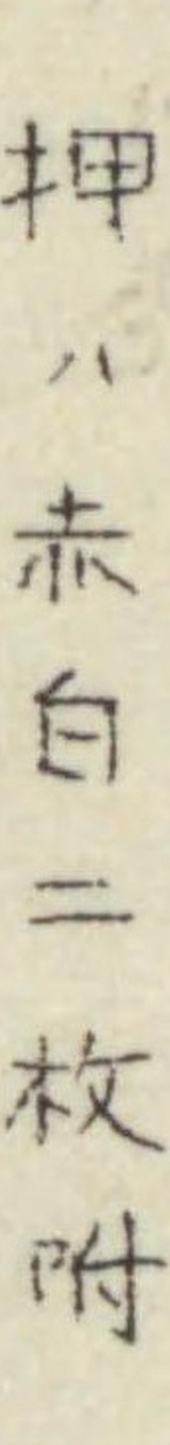押ハ赤白二紋付
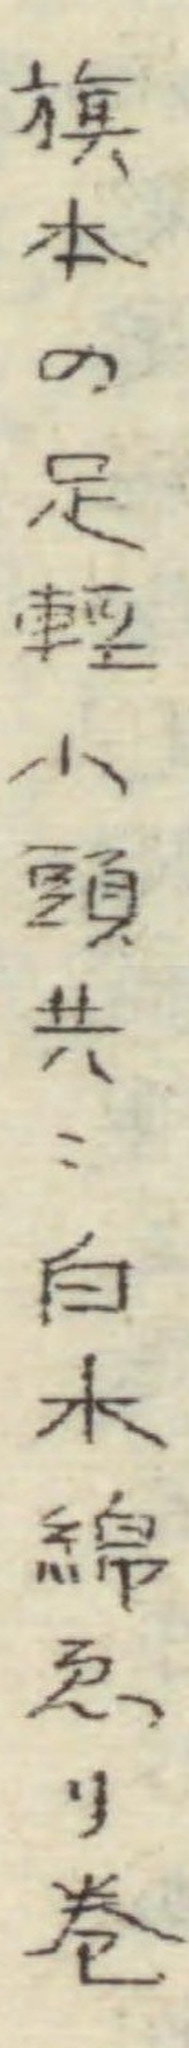旗本の足軽ハ頭共二白木綿ゑり巻
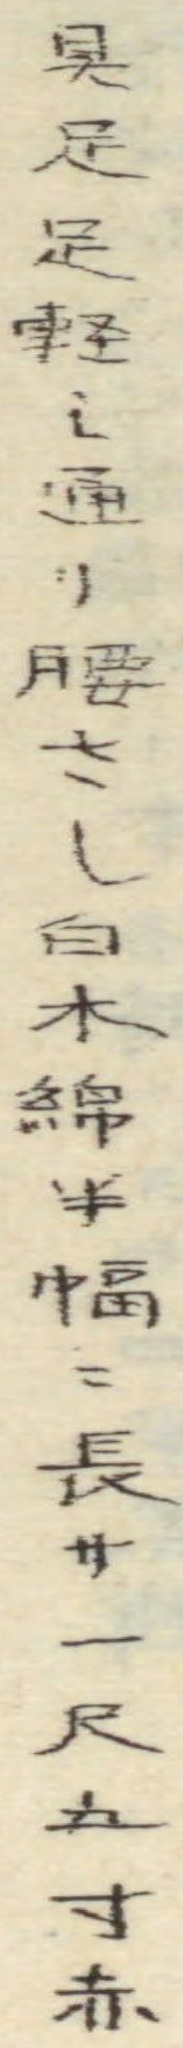具足足軽之通り腰さし白木綿半幅二長サ一尺五寸赤
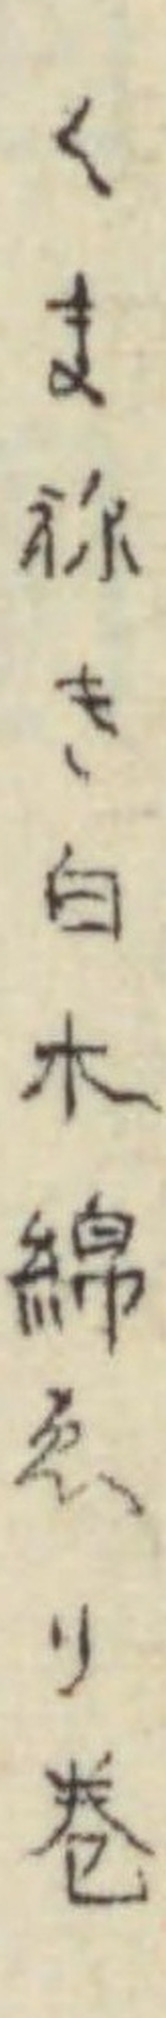くまねき白木綿ゑり巻
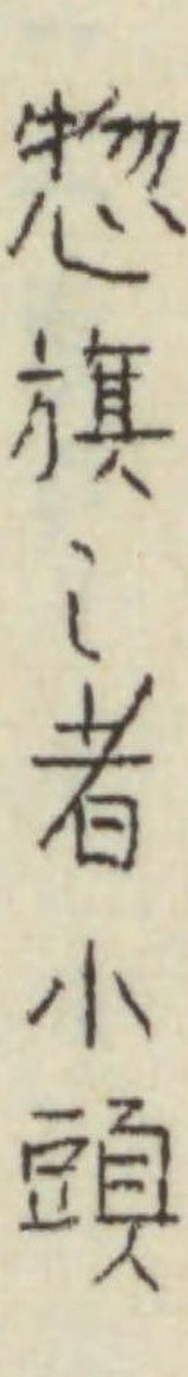惣旗之者小頭
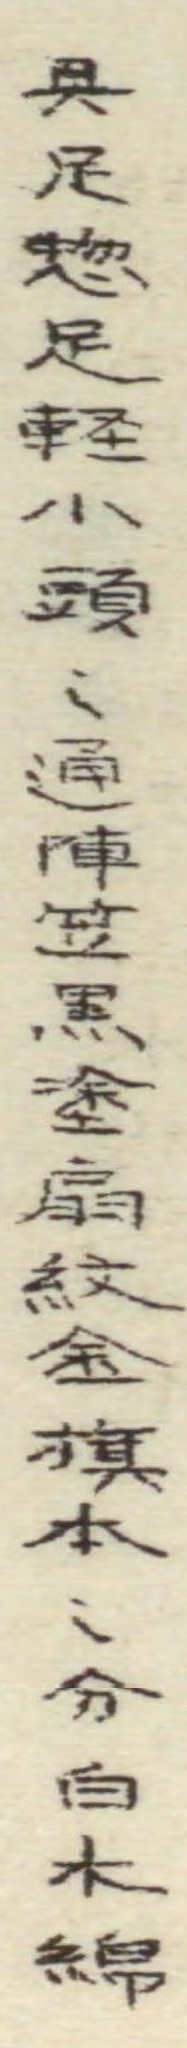具足惣足軽小頭之通陣笠黒塗扇紋金ハ旗本之分白木綿
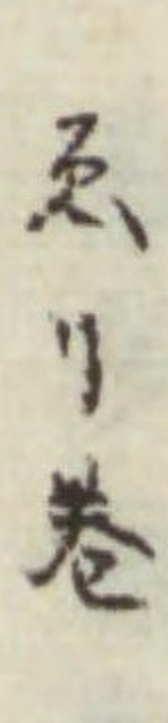ゑり巻
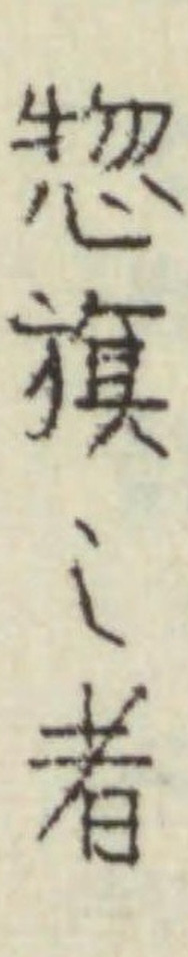惣旗之者
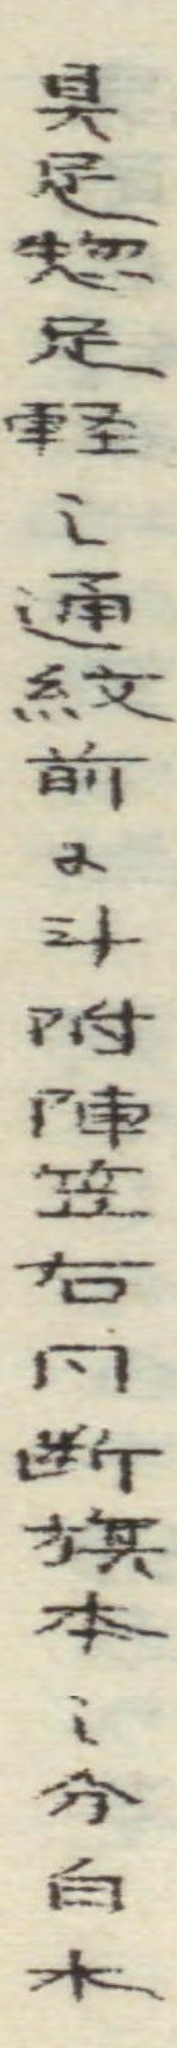具足惣足軽之通紋前に斗附陣笠右同断旗本之分白木
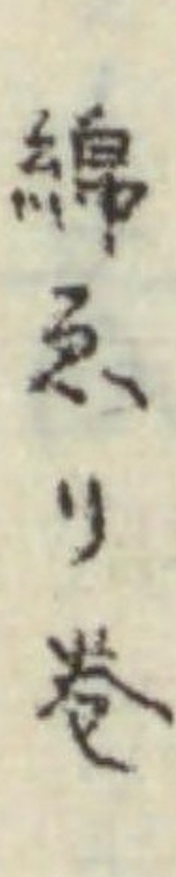綿ゑり巻
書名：三河吉田藩動員史料
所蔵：国立国会図書館 National Diet Library, JAPAN
